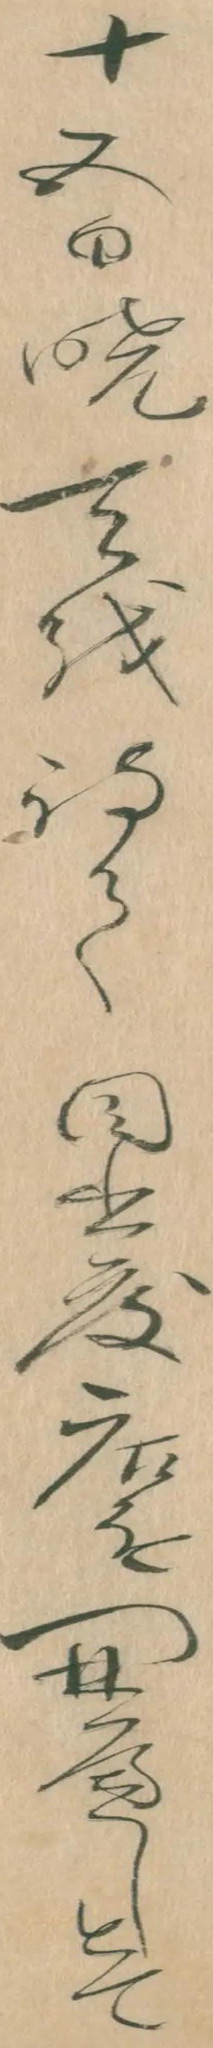十五日暁天を持て目出度店を開へしとて
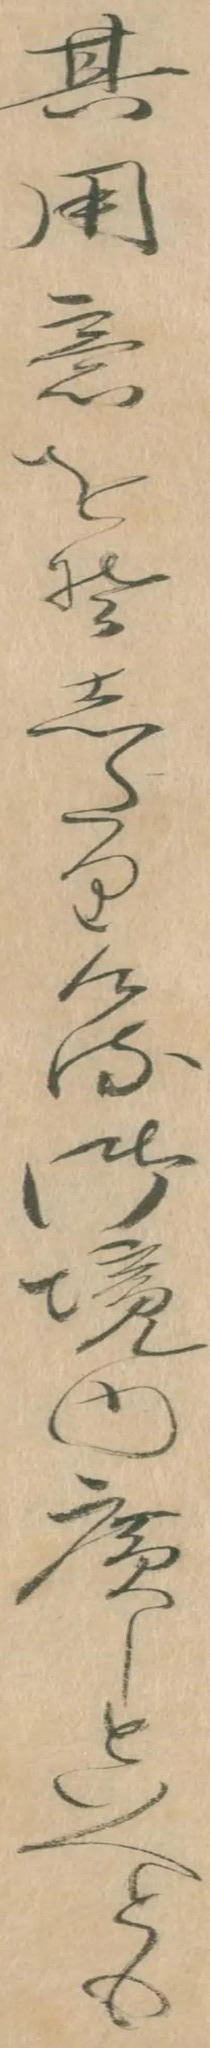其用意をそしたりける御境内廣しといへとも

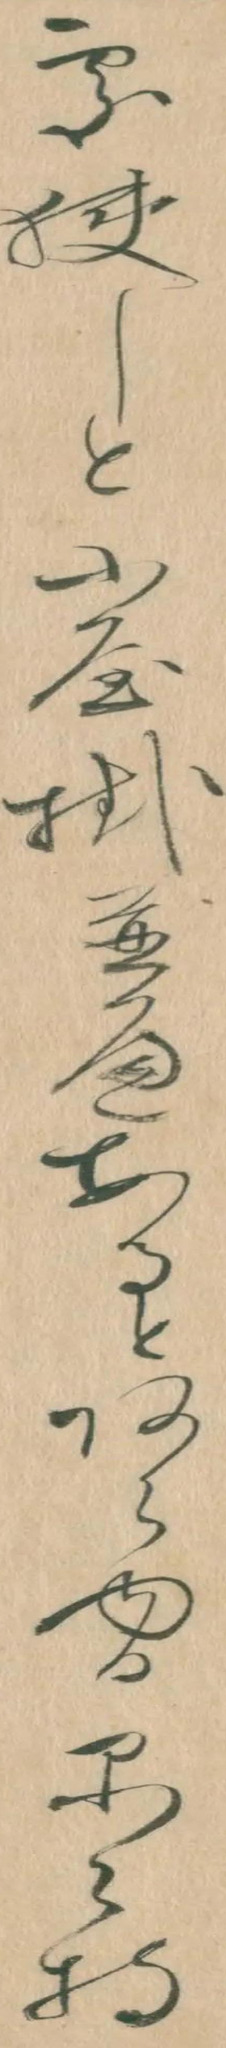處狭しと小屋掛並へあるとあらゆる品々持
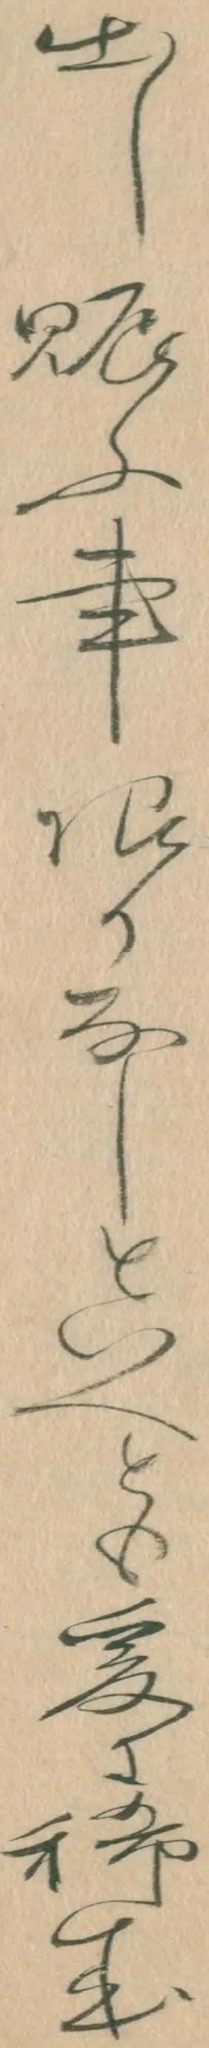出し賑ふ事限りなしといへとも爰に稀成
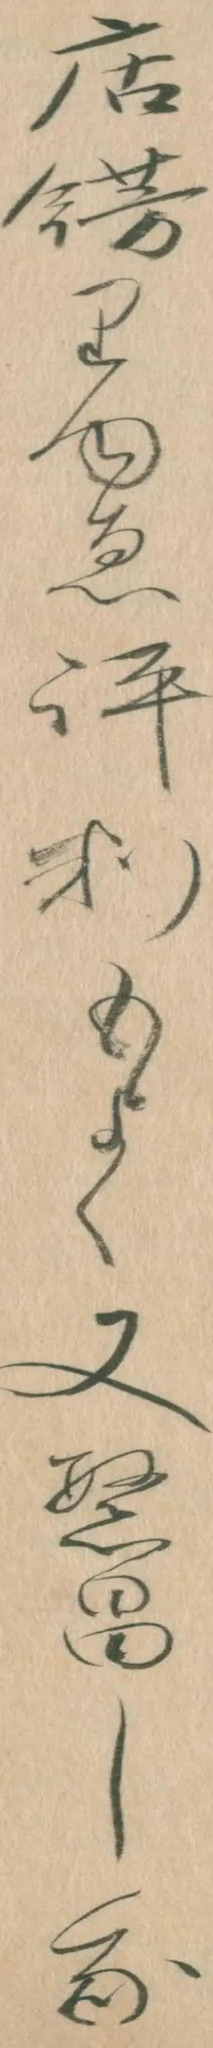店錺りゆゑ評判もよく又繁昌し我
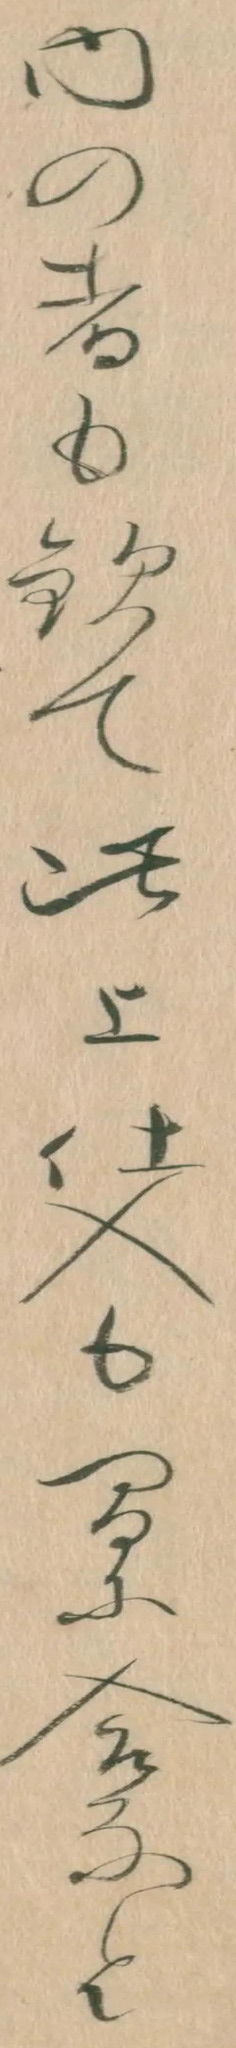内の者も歓て此上仕入も間に合なは
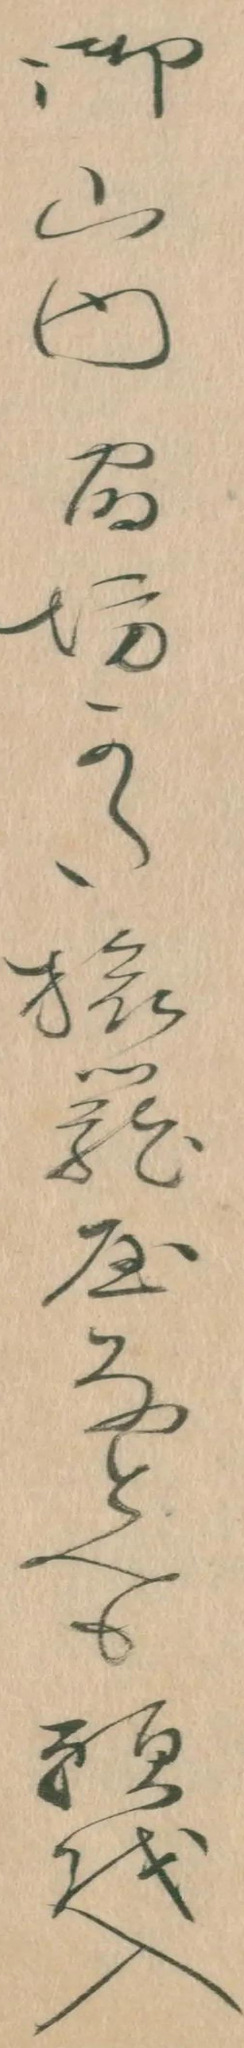御山内宿坊かた旅籠屋なとへも願を入れ
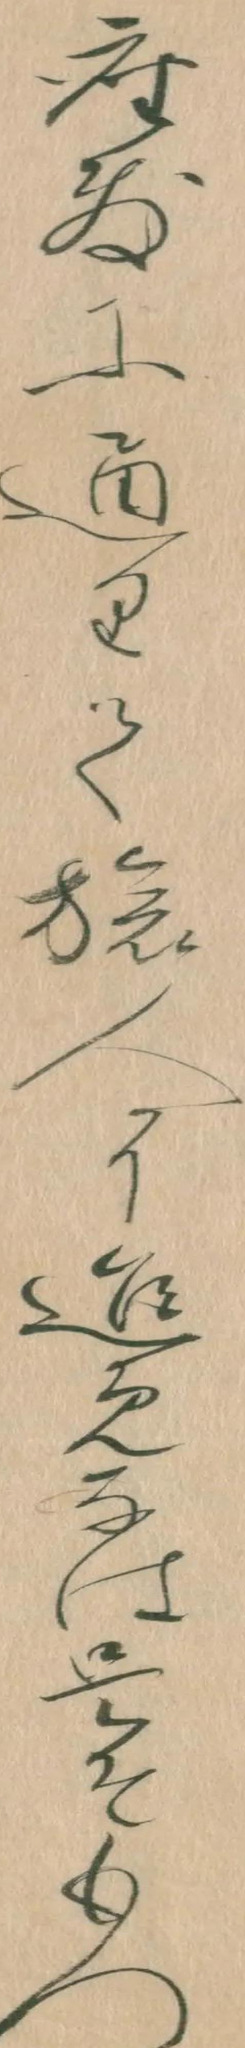座敷に通りて旅人に進めなは是そもつ
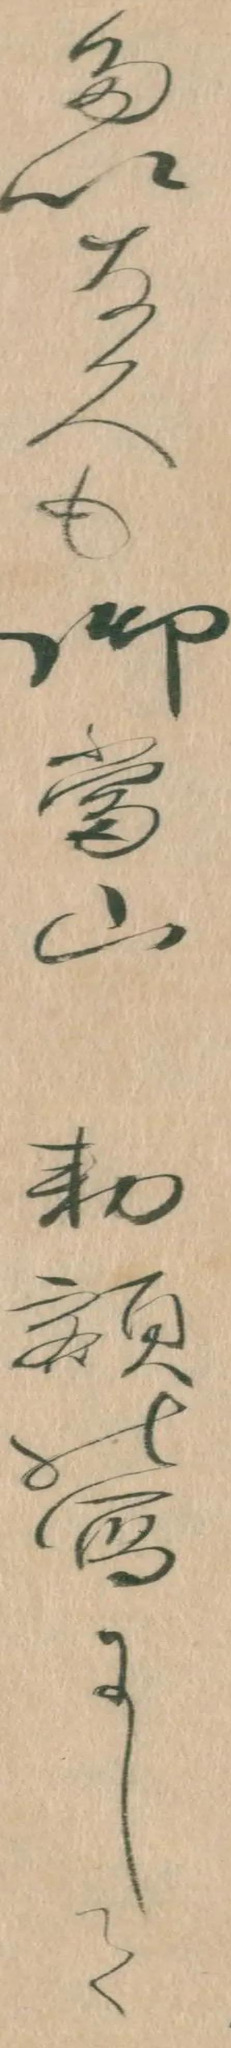たいなくも御當山勅額の写にして
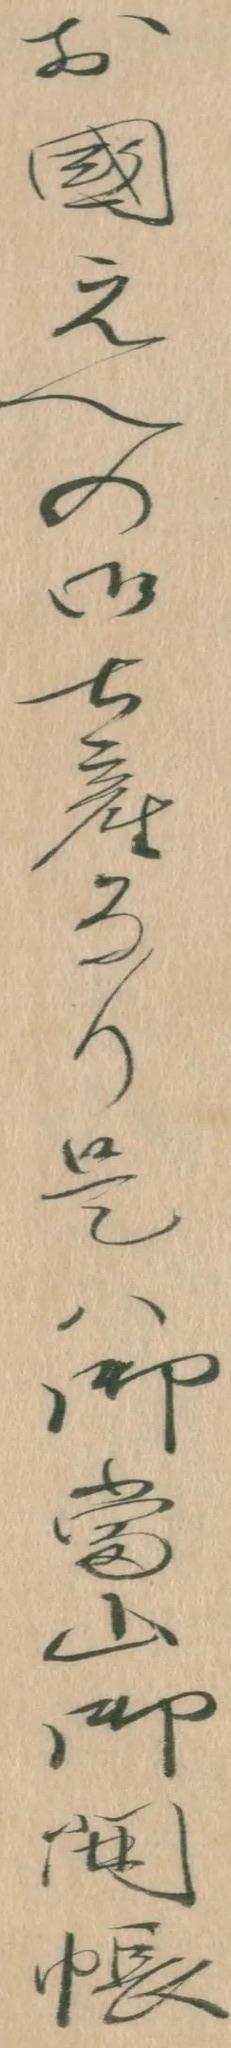お國元への御土産なり是は御當山御開帳
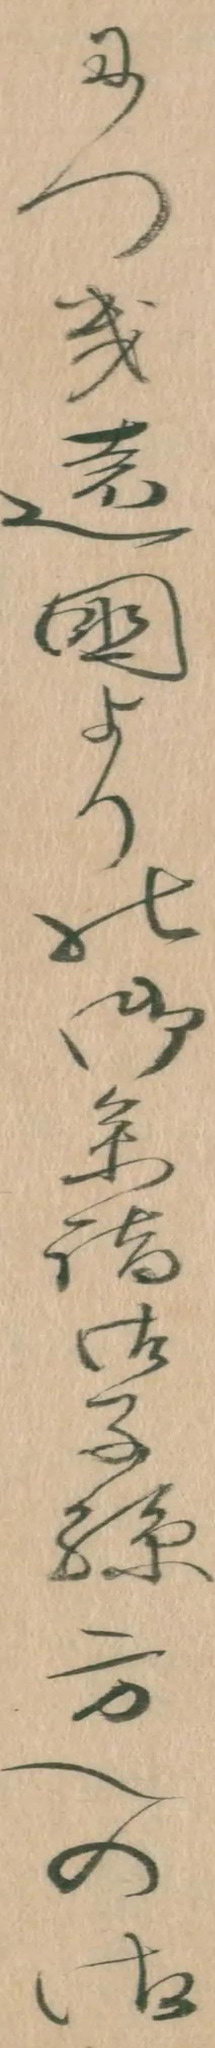につき遠國よりの御参詣御子孫方への御
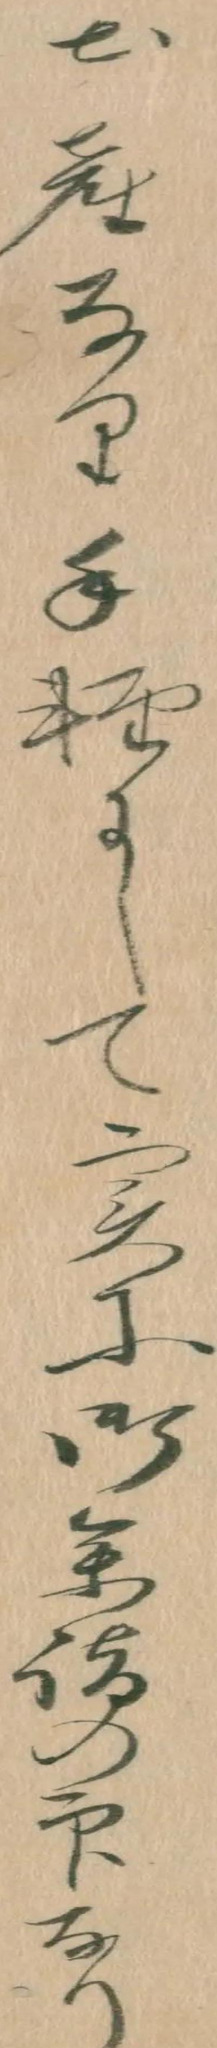土産なり手軽にして実に御参詣の印なり
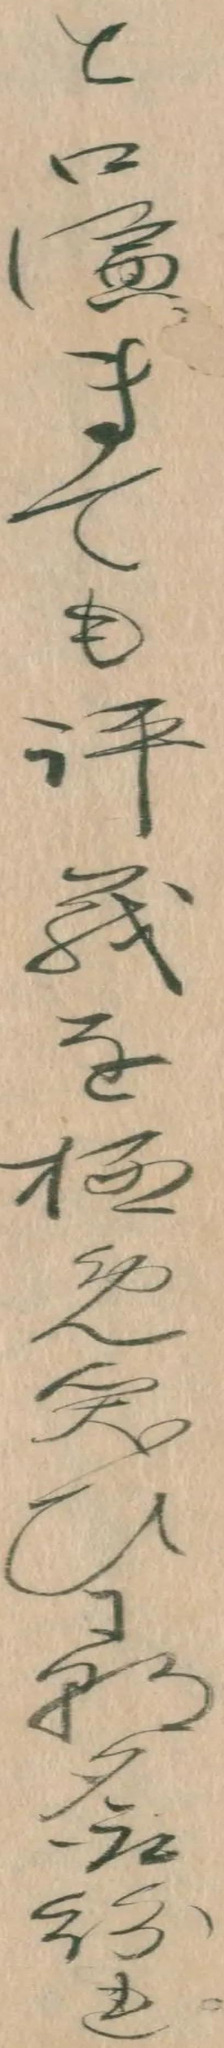と口演まても評義を極め笑ひに朝夕取紛れ
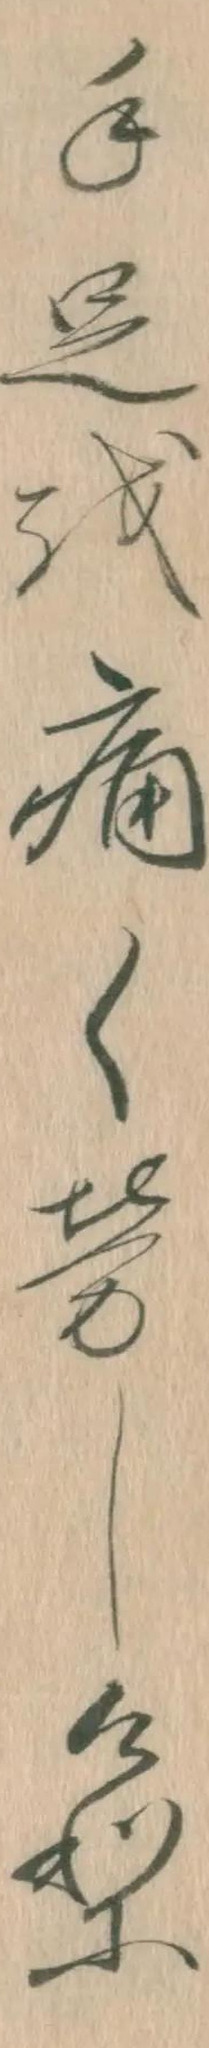手足を痛く労しけり
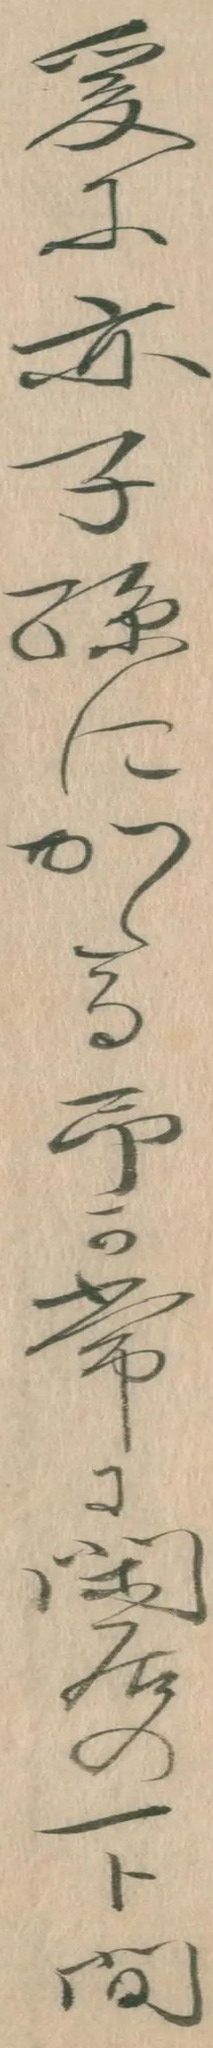爰に亦子孫にかたる予か常に閑居の一ト間
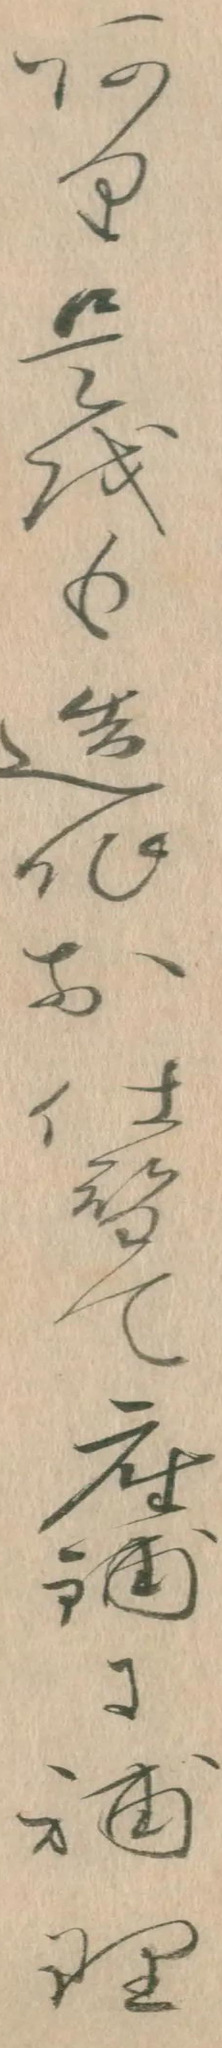あり是をも造作お仕替て座鋪に補理
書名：俗語之種. [2]
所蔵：国立国会図書館 National Diet Library, JAPAN
